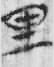里
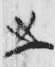之
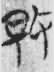○（旦）
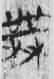無
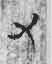又（有）
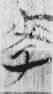李
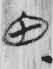甶（思）
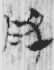阩
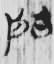門
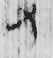又（有）
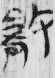敗
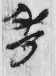秀
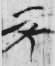不
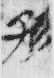孫
